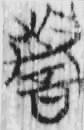諍
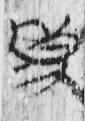事
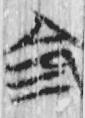命
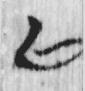㠯（以）
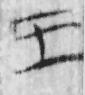王
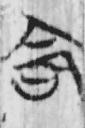命
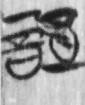○（屬）
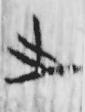之
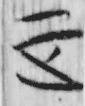正
